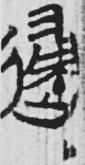歸
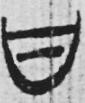甘
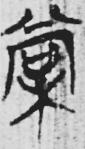棠
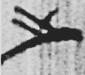之
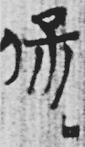保（報）
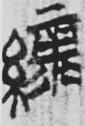綠
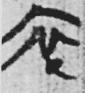衣
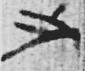之
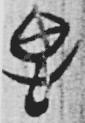思
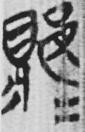燕燕
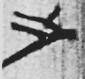之
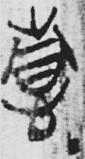情
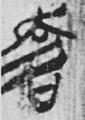害
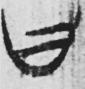曰
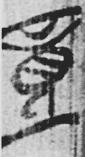童
